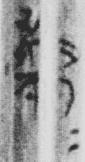柬柬
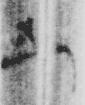之
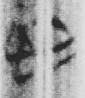心
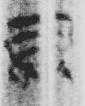鼎（則）
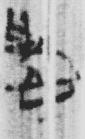○（采）
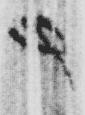又（有）
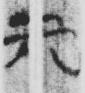亓（其）
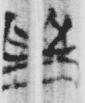爲
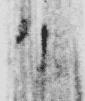人
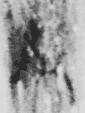之
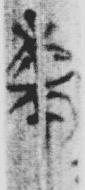柬柬
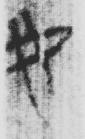女（如）
